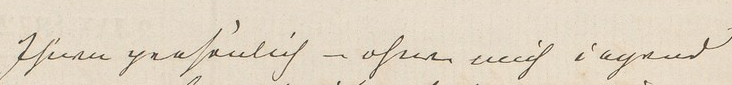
Ihnen persönlich – ohne mich irgend
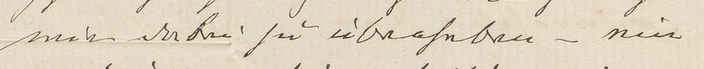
wie dabei zu überheben – ein
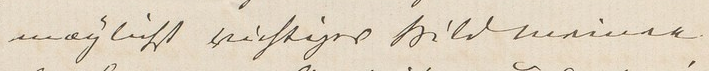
möglichst richtiges Bild meiner
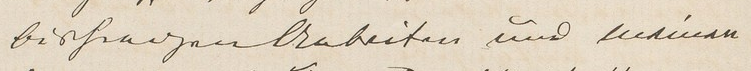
bisherigen Arbeiten und meiner
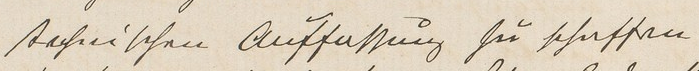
technischen Auffassung zu schaffen –
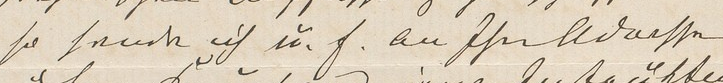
so sende ich u. f. an Ihre Adresse
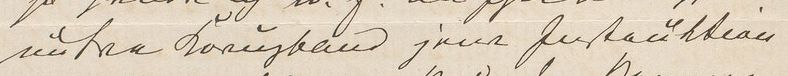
unter Kreuzband jene Instruktion
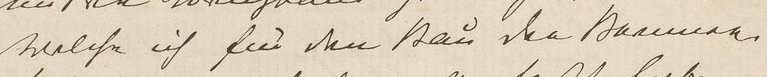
welche ich für den Bau der Brenner -
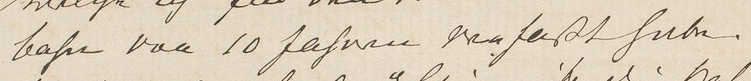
bahn vor 10 Jahren verfaßt habe.
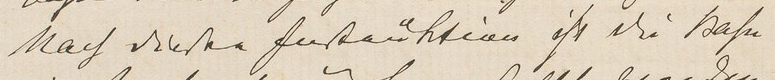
Nach dieser Instruktion ist die Bahn
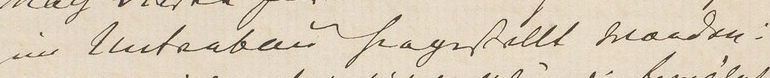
im Unterbau hergestellt worden:
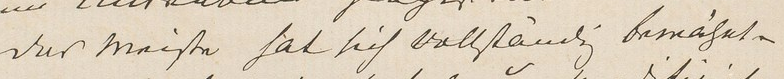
Das Meiste hat sich vollständig bewährt –
